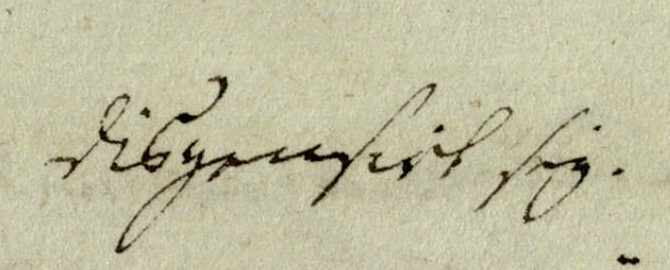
dispensirt seÿ.
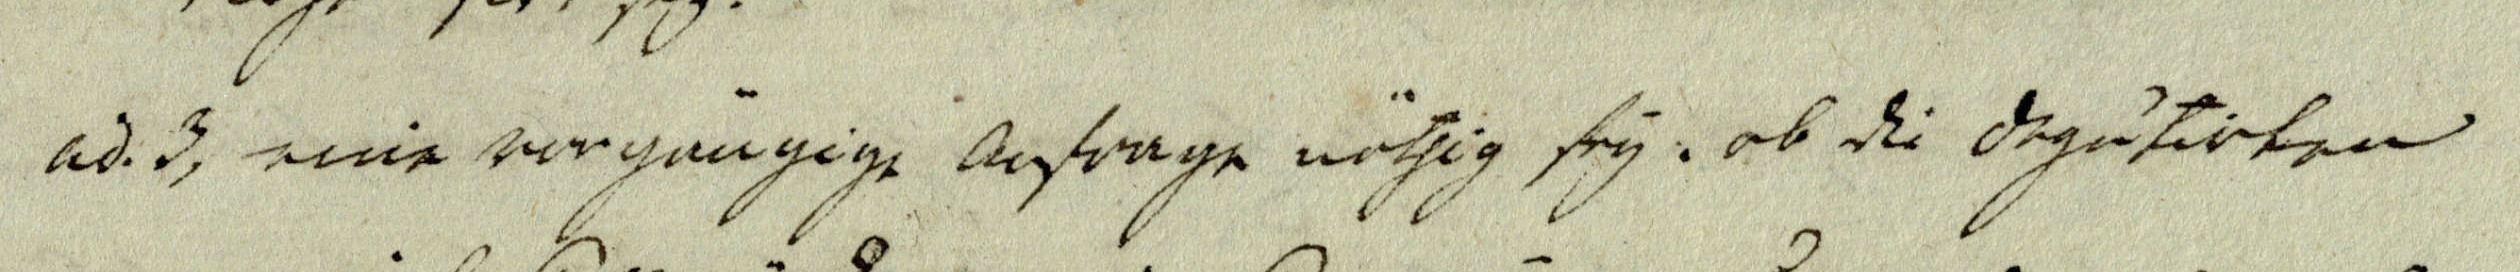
ad. 3., eine vorgängige Anfrage nöthig seÿ: ob die Deputirten
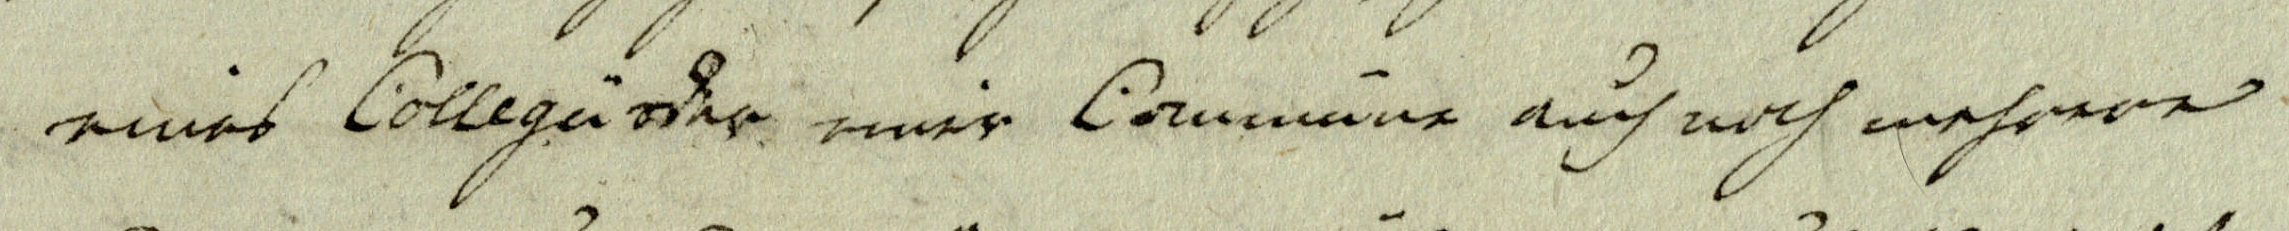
eines Collegii oder einer Commune auch noch mehrere
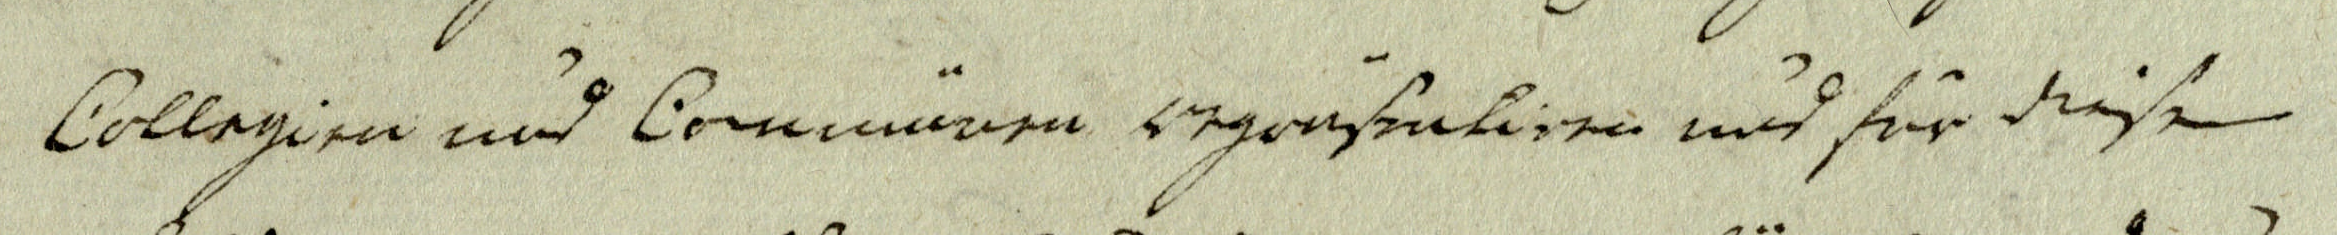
Collegien und Commünen repräsentiren und für diese
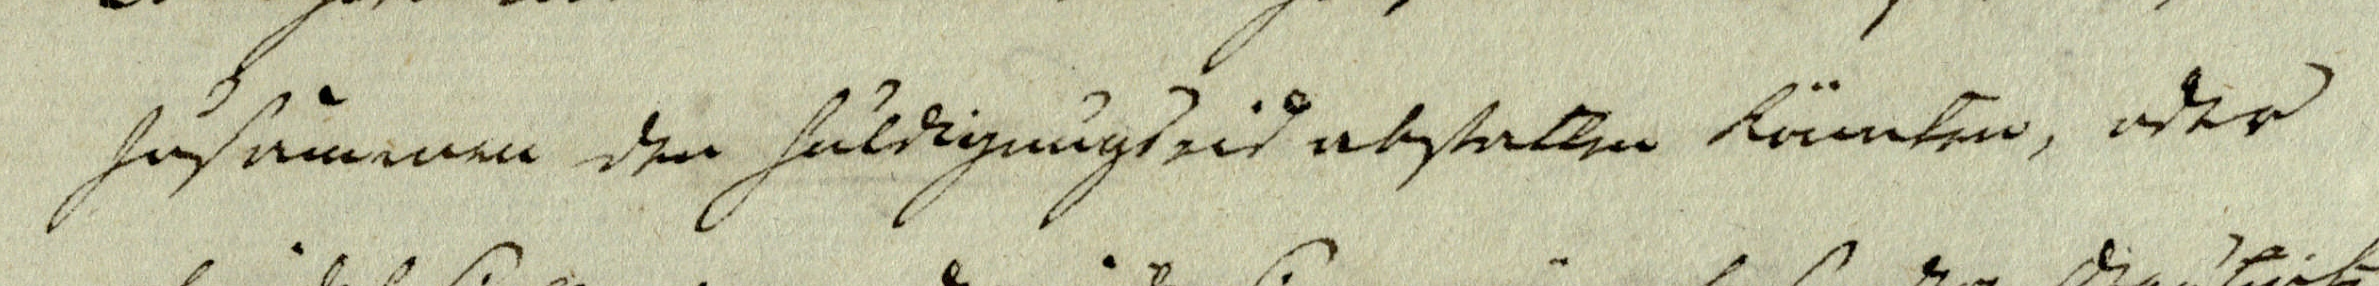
zusammen den Huldignngseid abstatten könnten, oder
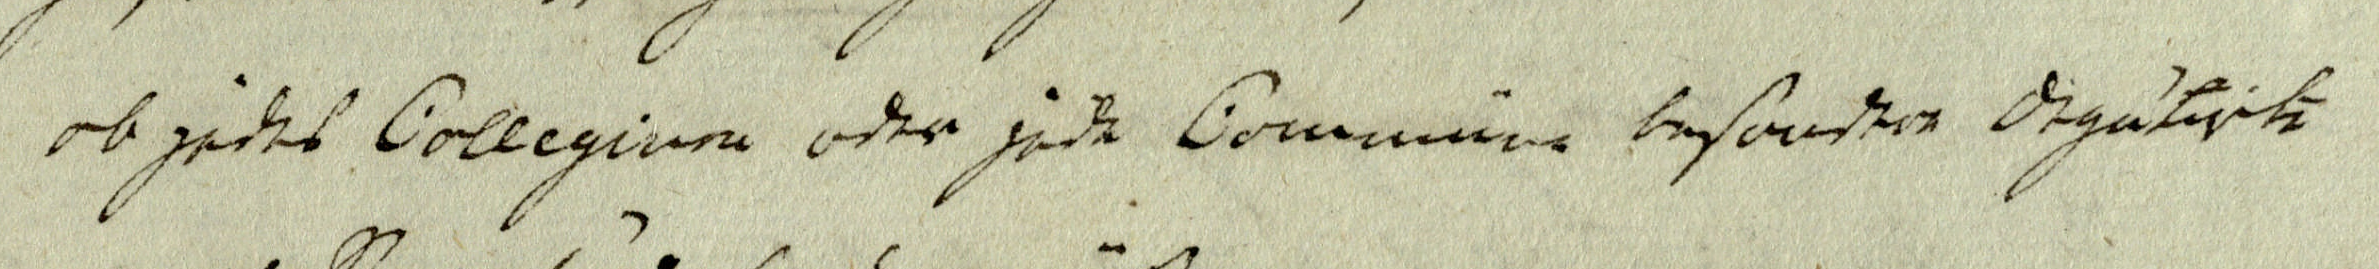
ob jedes Collegium oder jede Commune besondere Deputirte
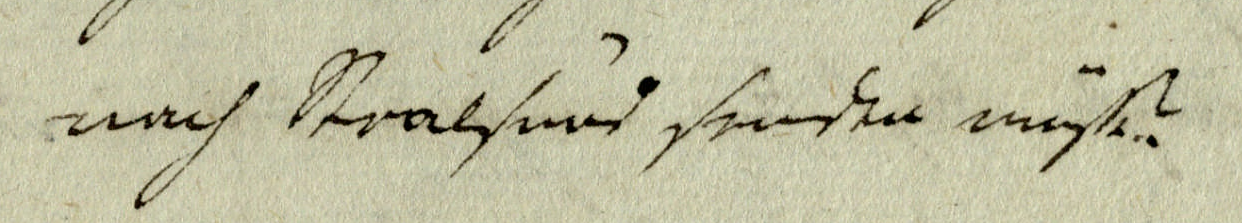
nach Stralsund senden müsse.
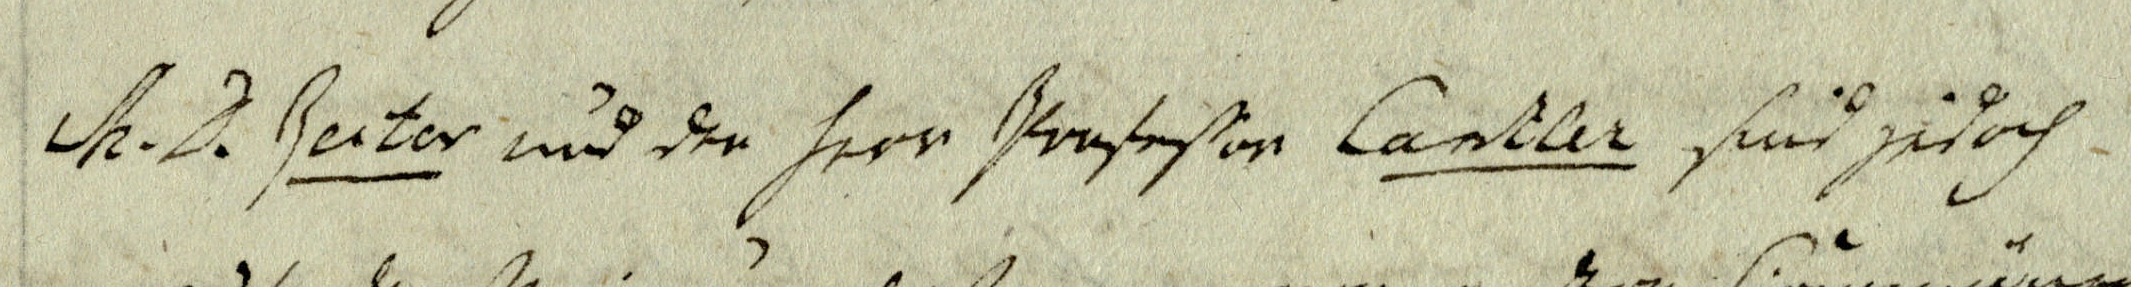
M. D. Rector und der Herr Professor Canzler sind jedoch
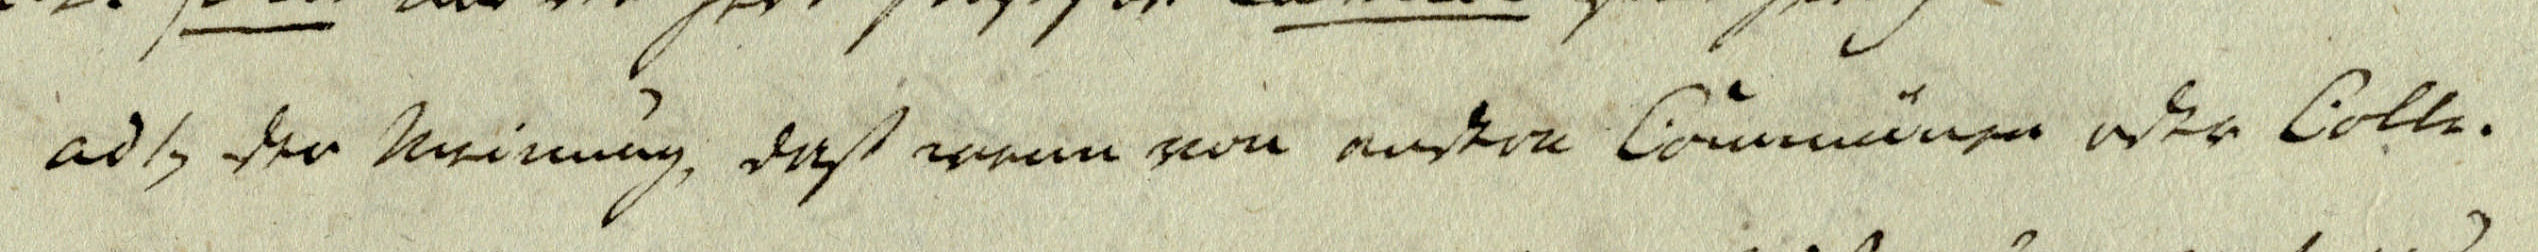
ad 1. der Meinung, daß wenn von andern Commünen oder Colle¬
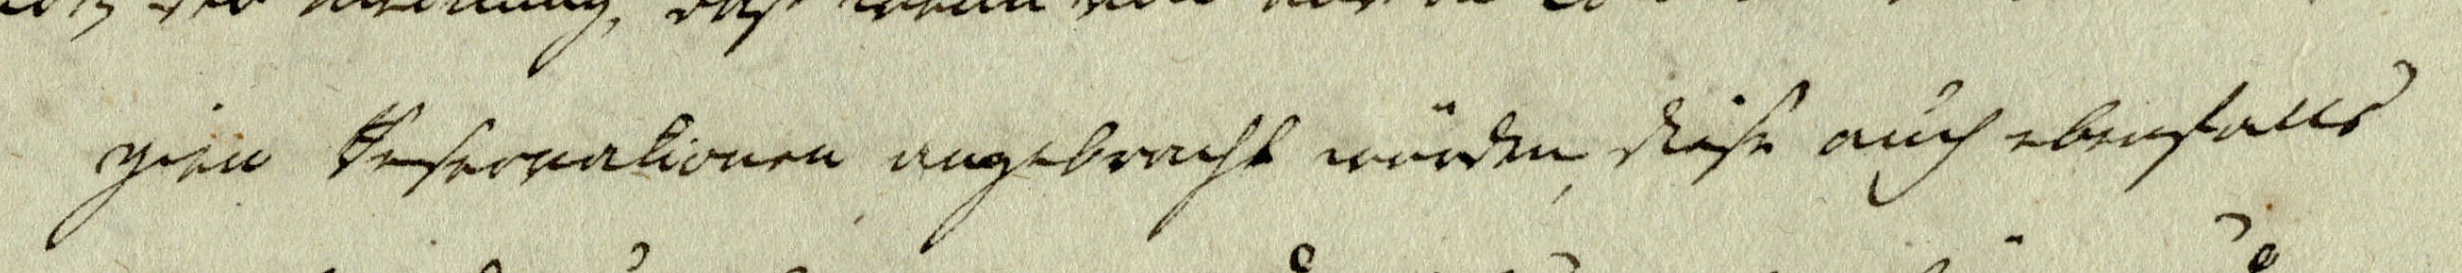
gien Reservationen angebracht würden, diese auch ebenfalls
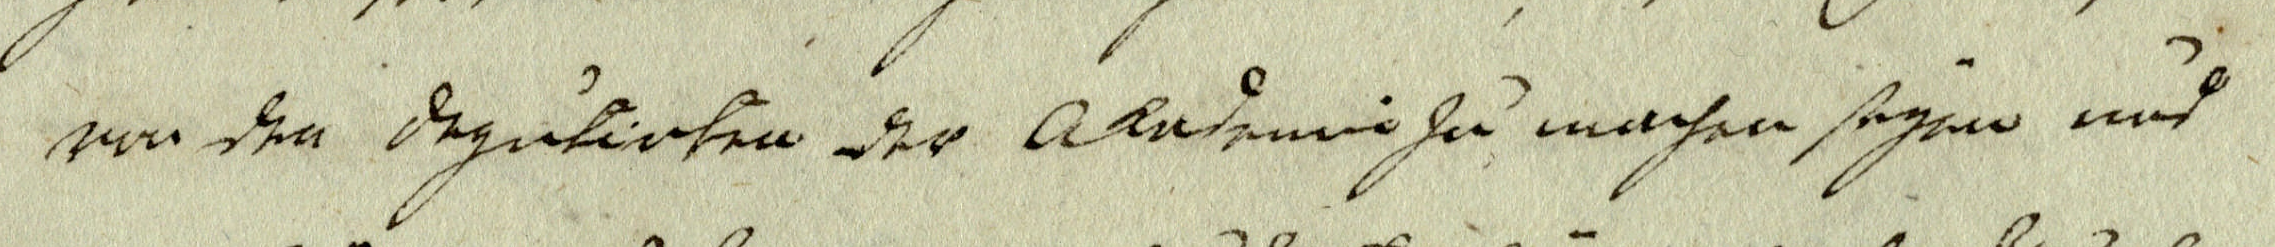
von den Deputirten der Akademie zu machen seÿen und
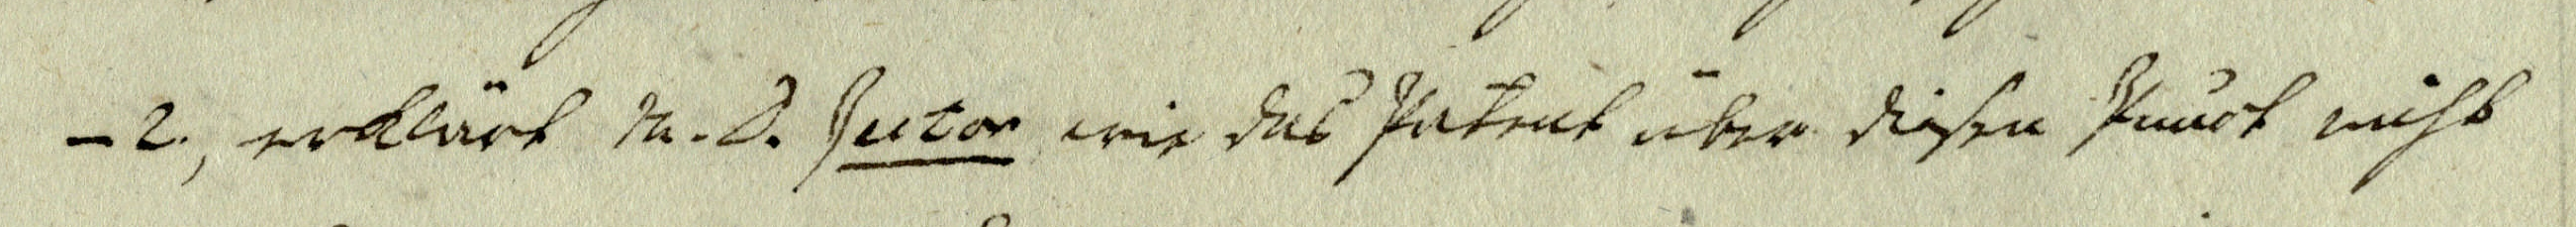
2, erklärt M. D. Rector, wie das Patent über diesen Punct nicht
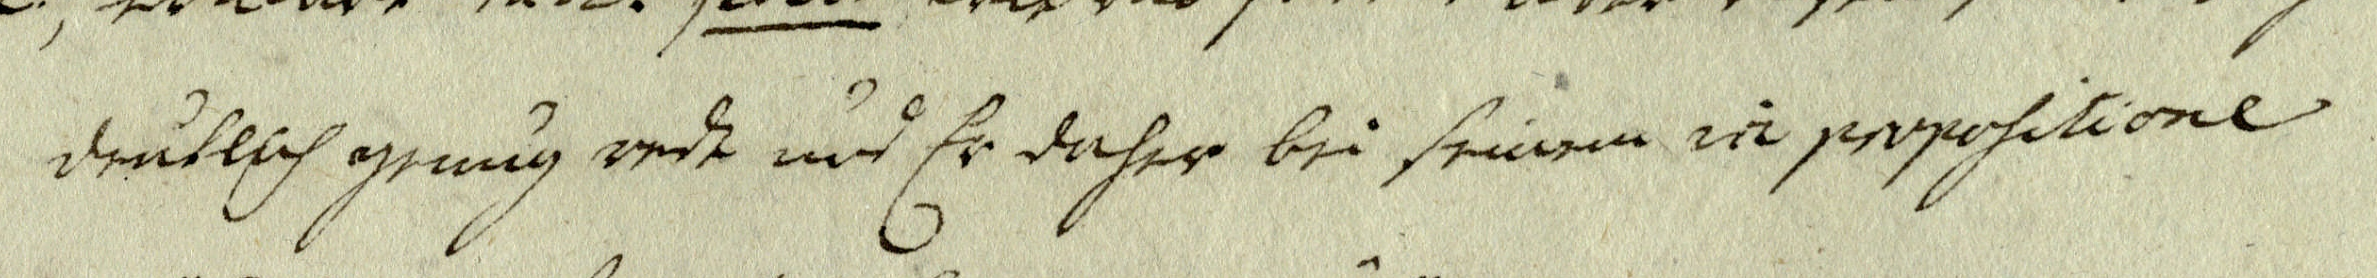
deutlich genug rede und Er daher bei seinem in propositione
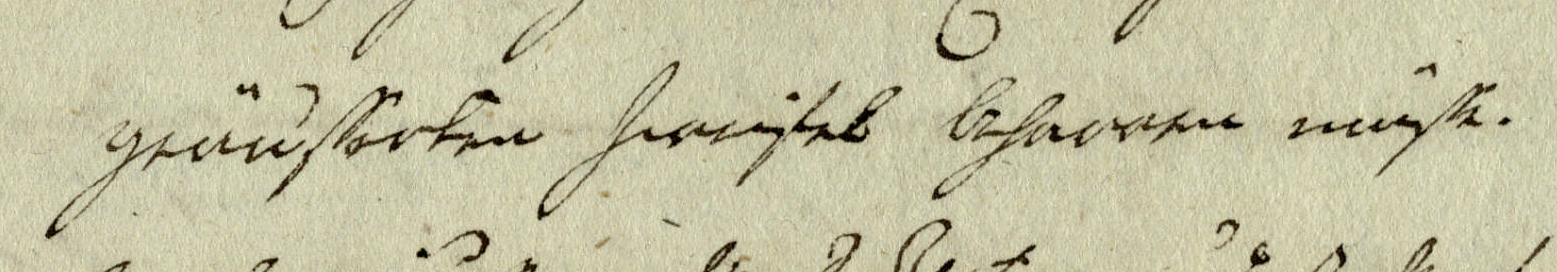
geäusserten Zweifel beharren müsse.
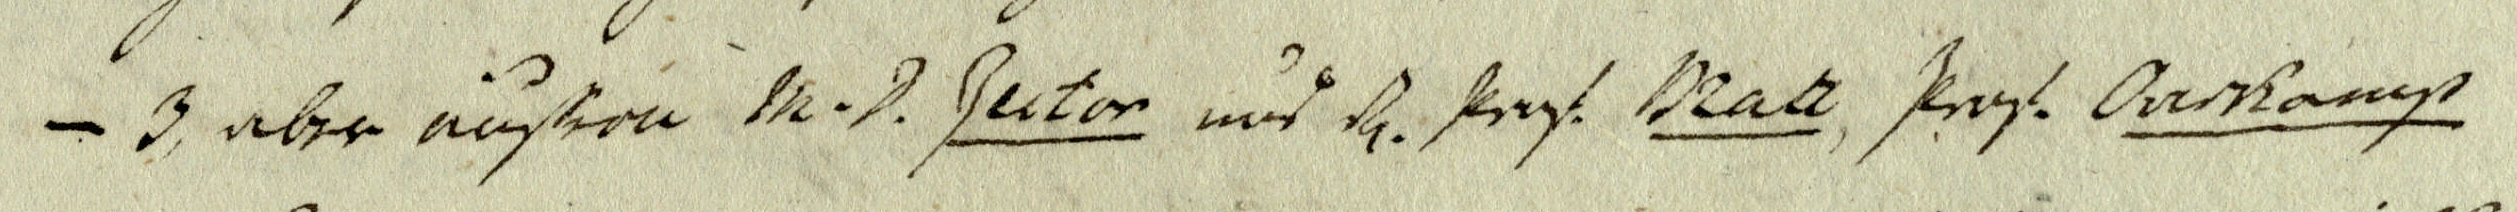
3, aber äussern M. D. Rector und dh. Prof. Bratt, Prof. Overkamp
